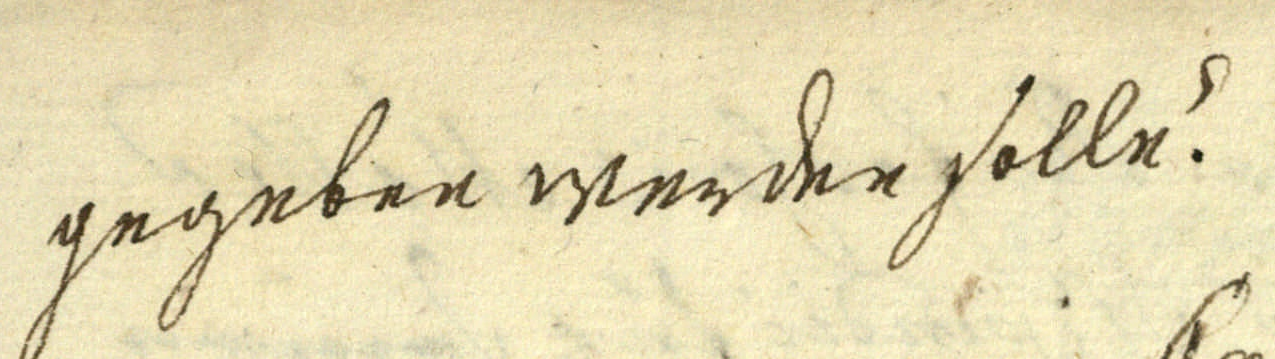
gegeben werden solle?
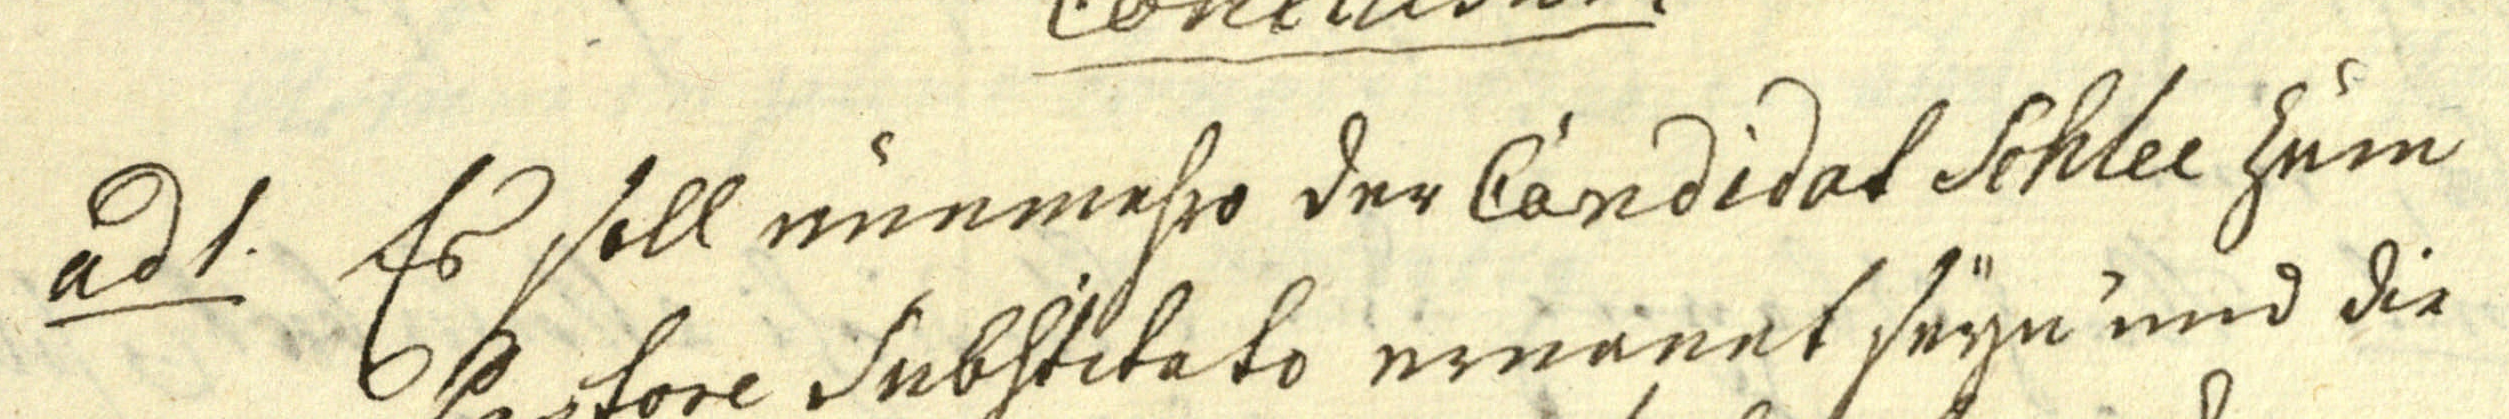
ad 1. Es soll nunmehro der Candidat Schlee zum
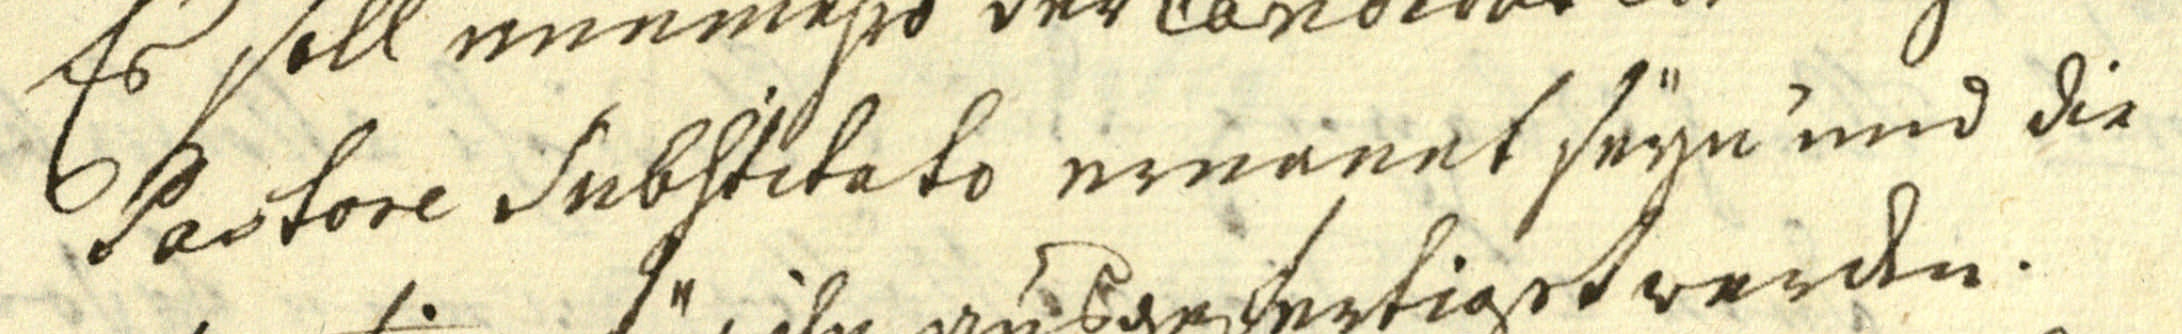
Pastore Substituto ernannt seÿn und die
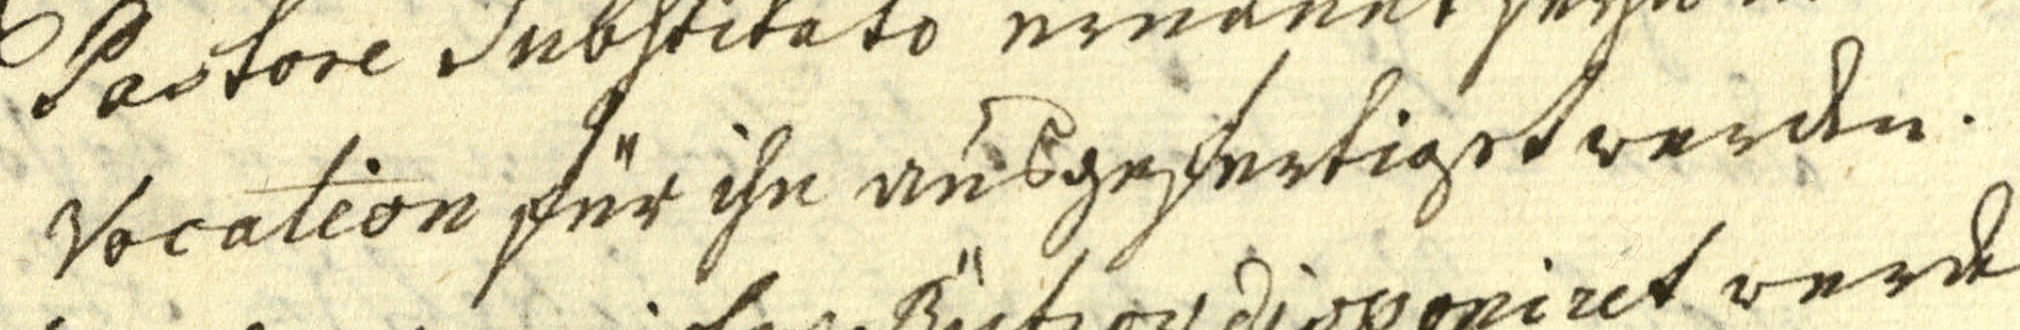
Vocation für ihn ausgefertiget werden.
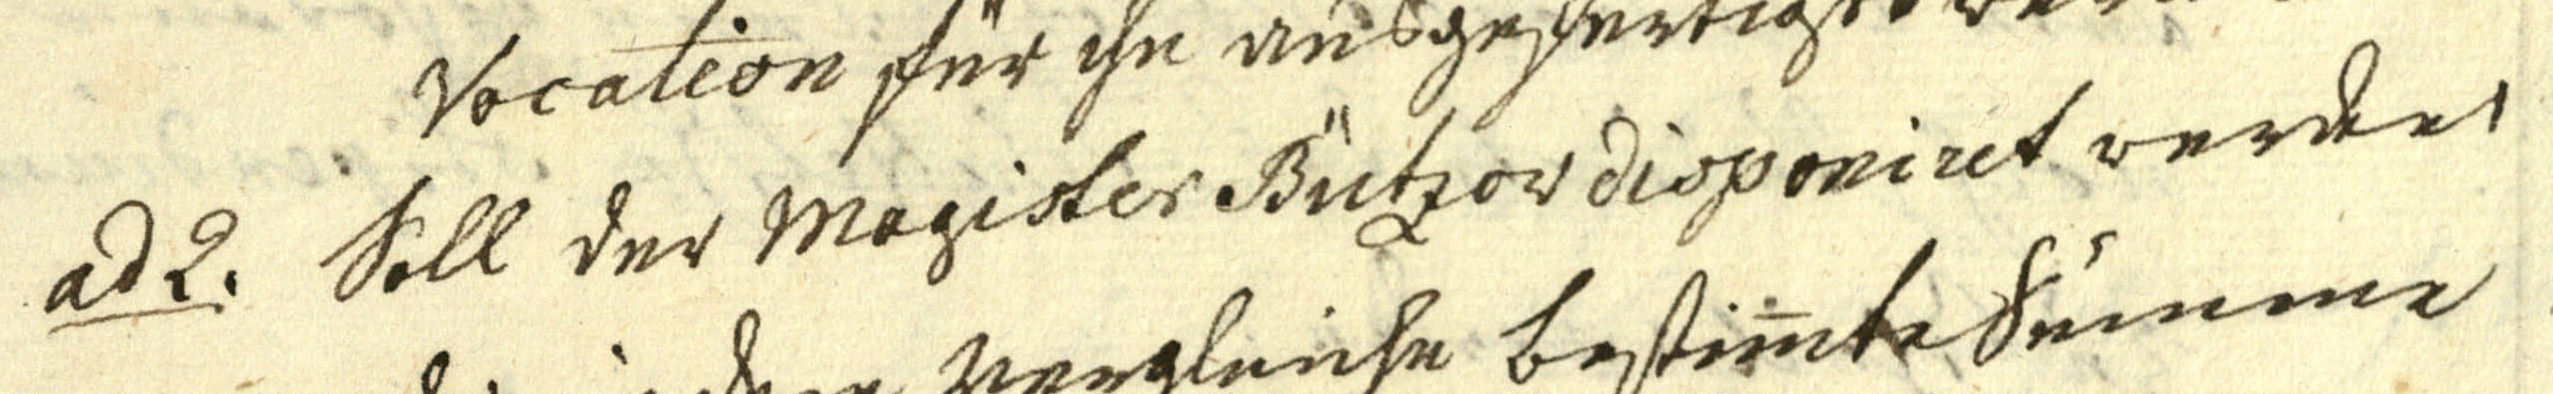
ad 2. Soll der Magister Bützow disponiret werden,
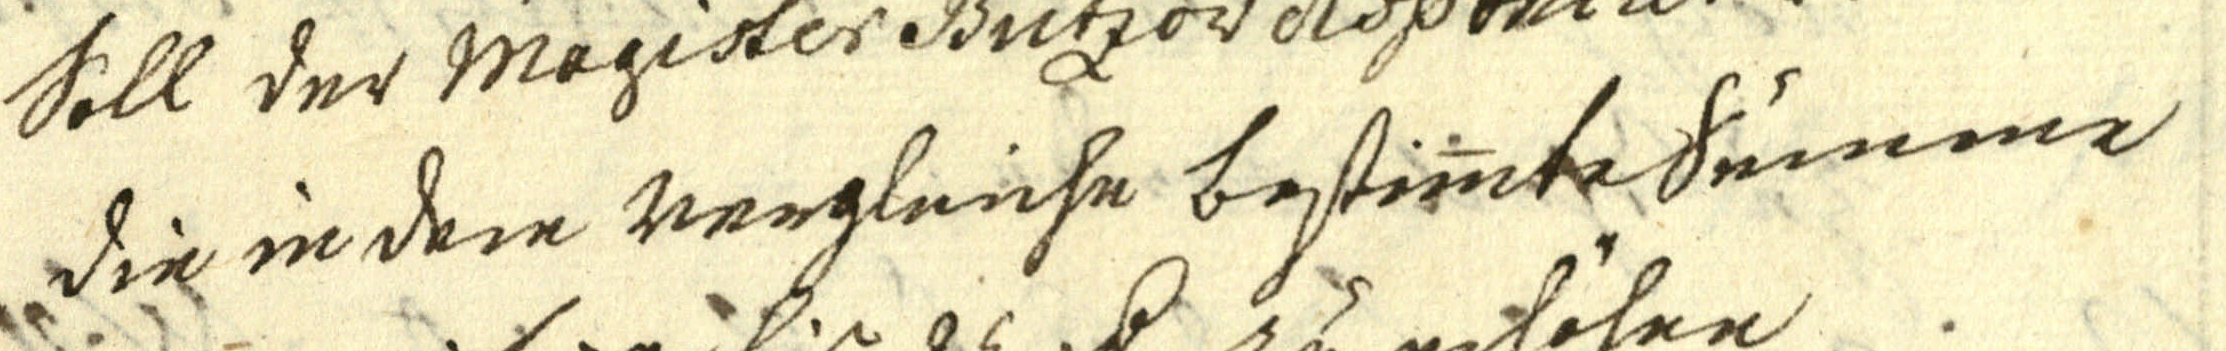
die in dem Vergleiche bestimte Summe
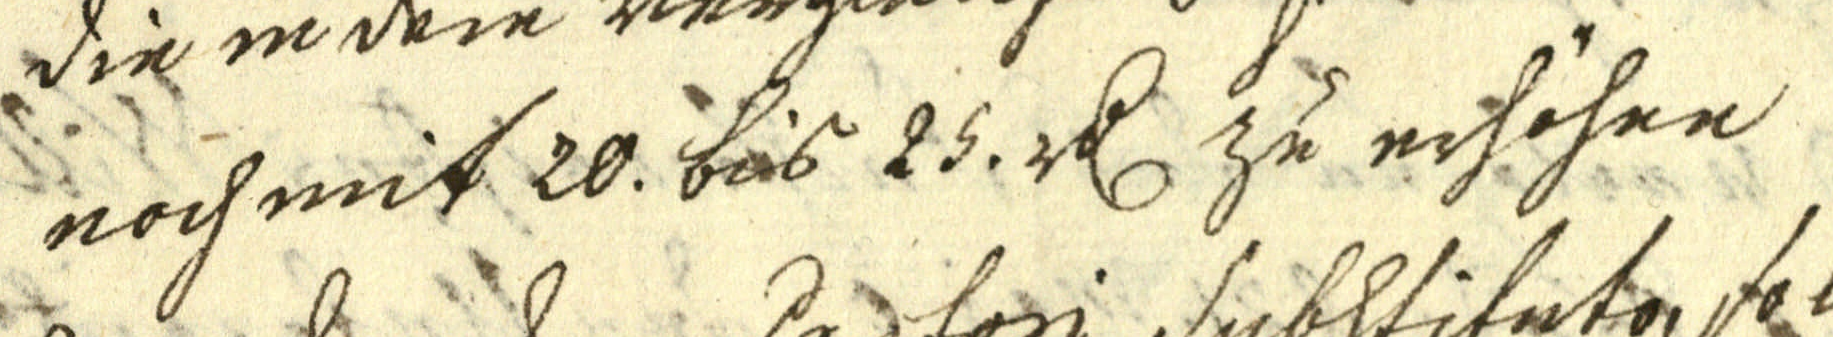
noch mit 20. bis 25. rl. zu erhöhen.
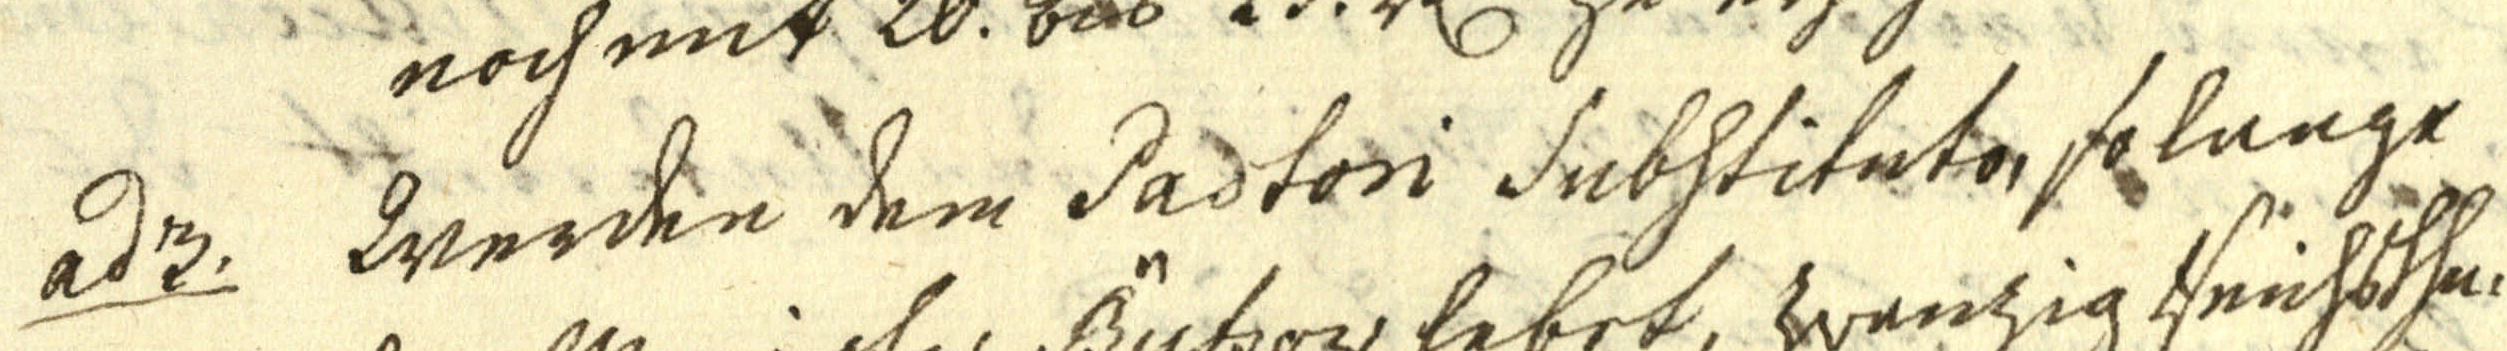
ad 3. Werden dem Pastori Substituto, so lange
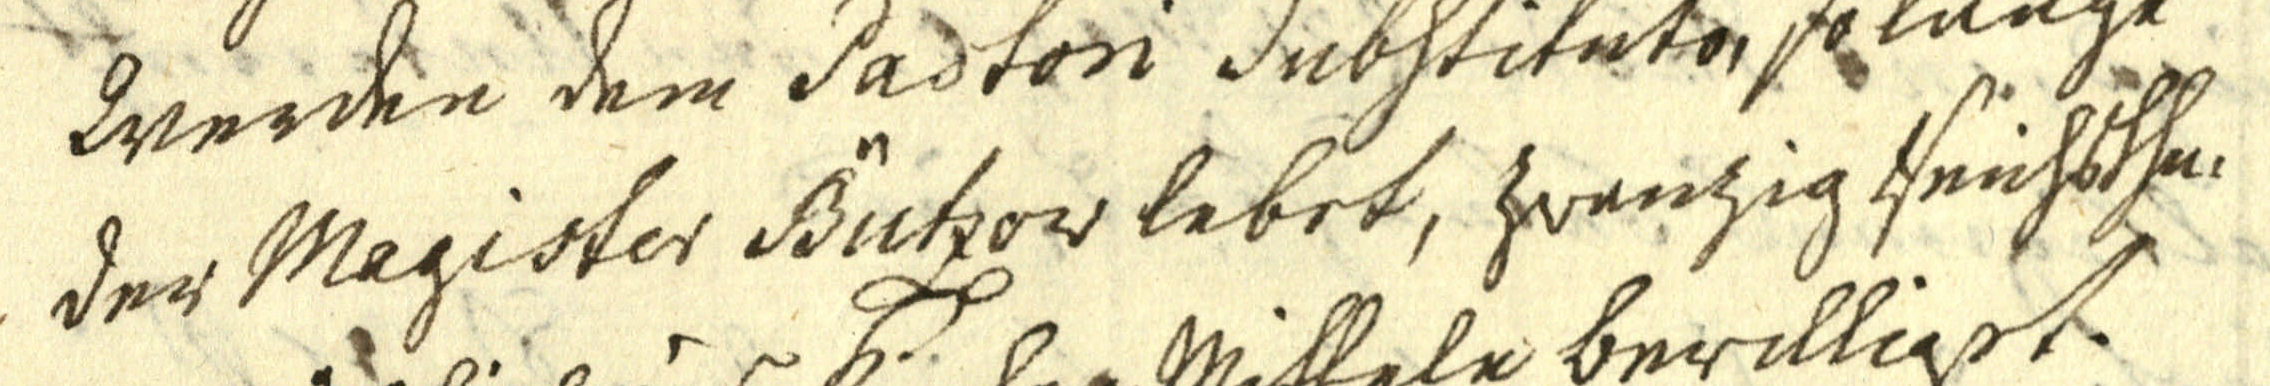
der Magister Bützow lebet, zwanzig Reichstha¬
